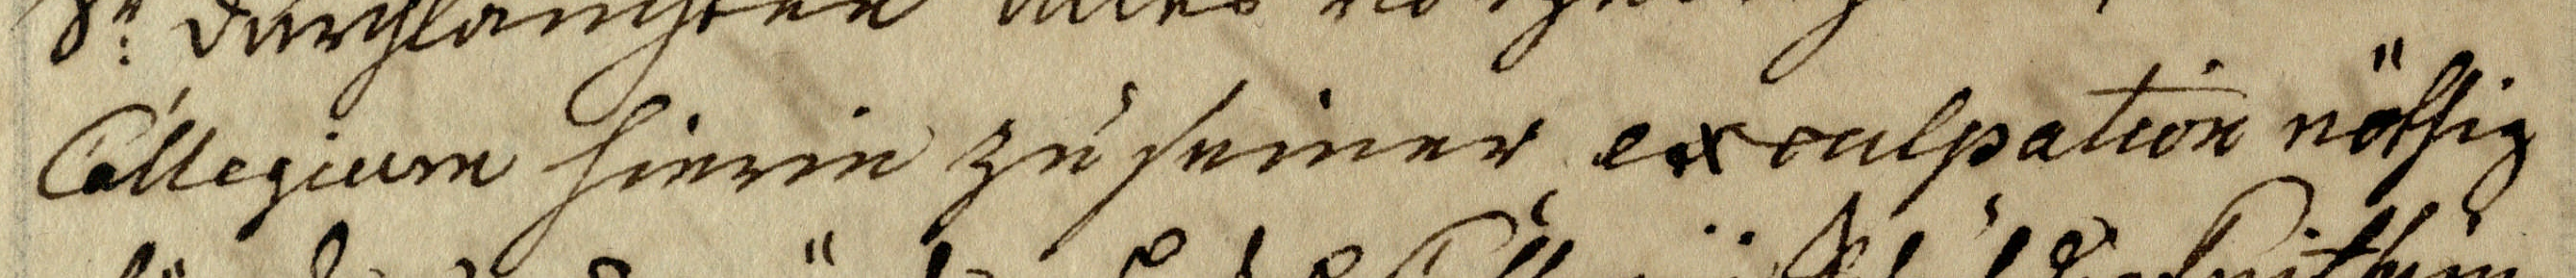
Collegium hierin zu seiner exculpation nöthig
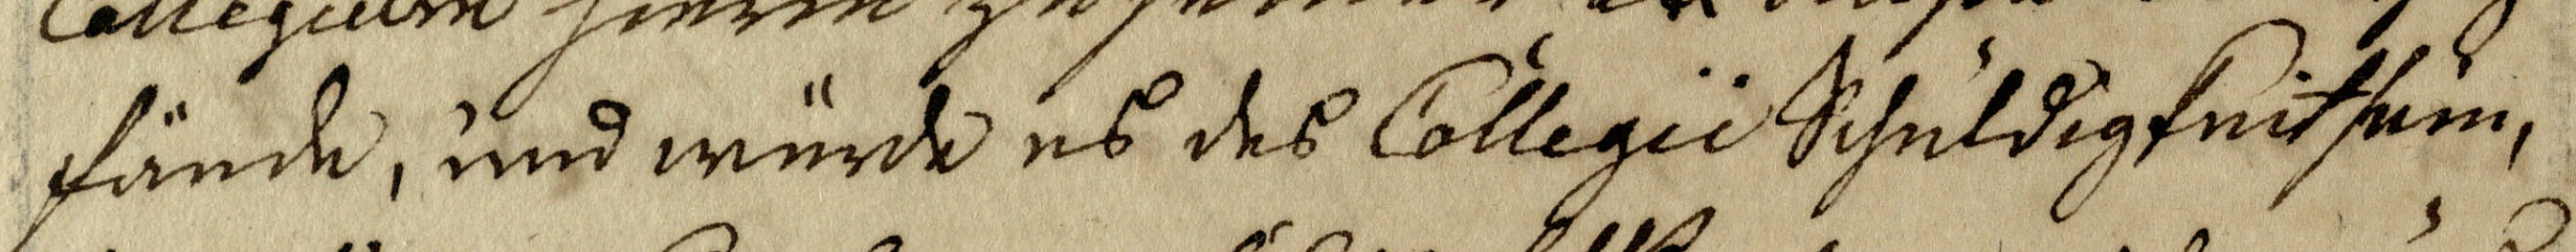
fände, und würde es des Collegii Schuldigkeit sein,
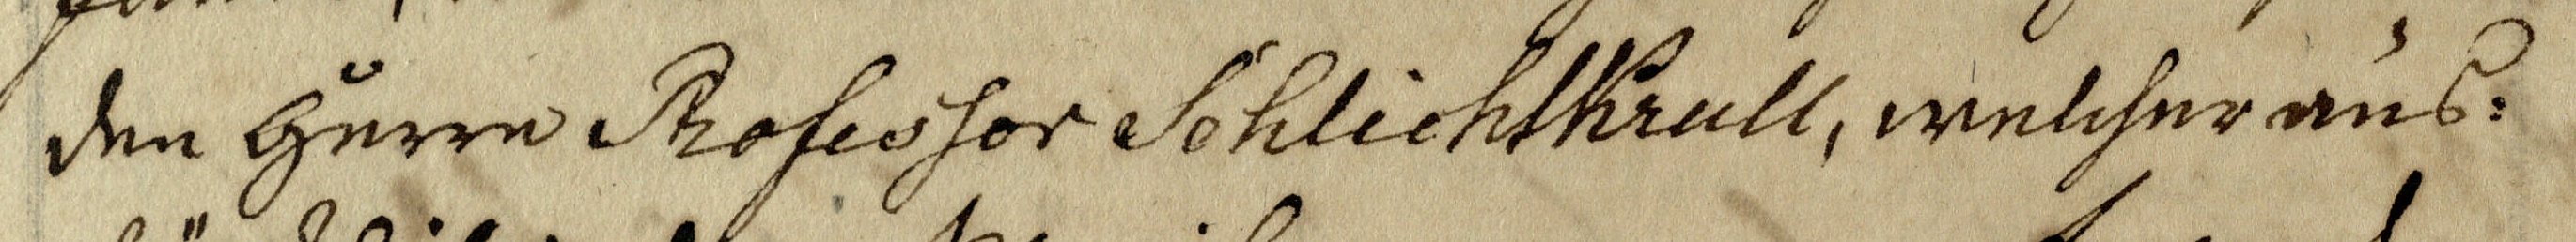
dem Herrn Professor Schlichtkrull, welcher aus¬
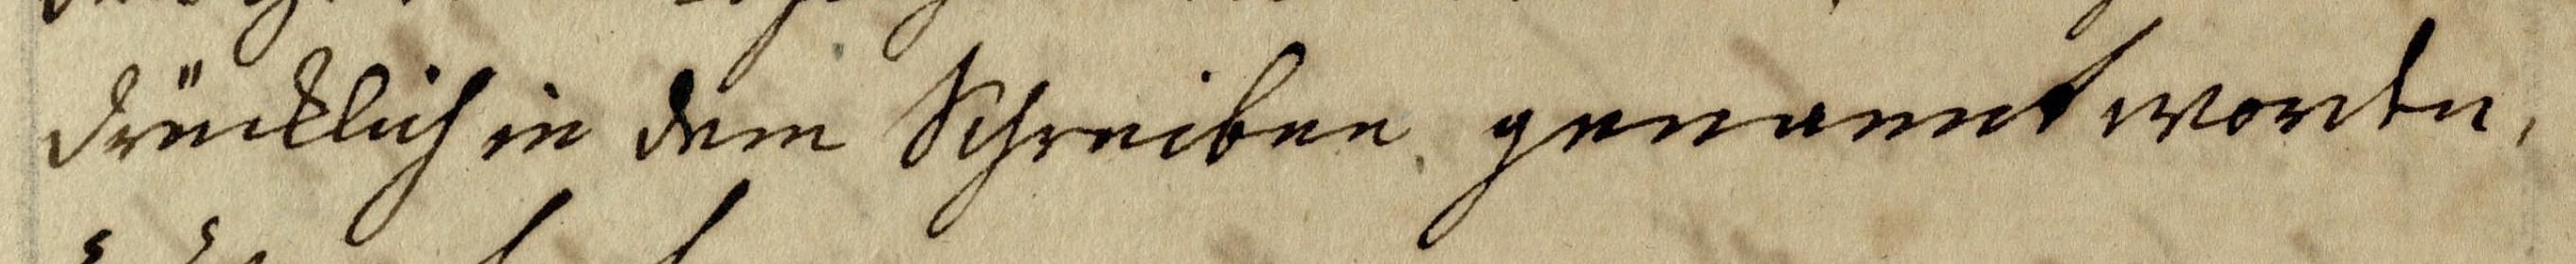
drücklich in dem Schreiben genannt worden,
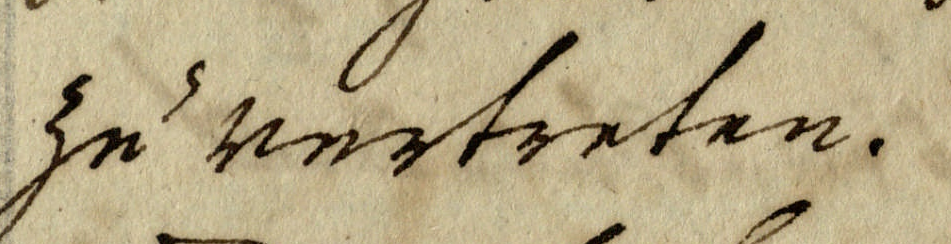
zu vertreten.
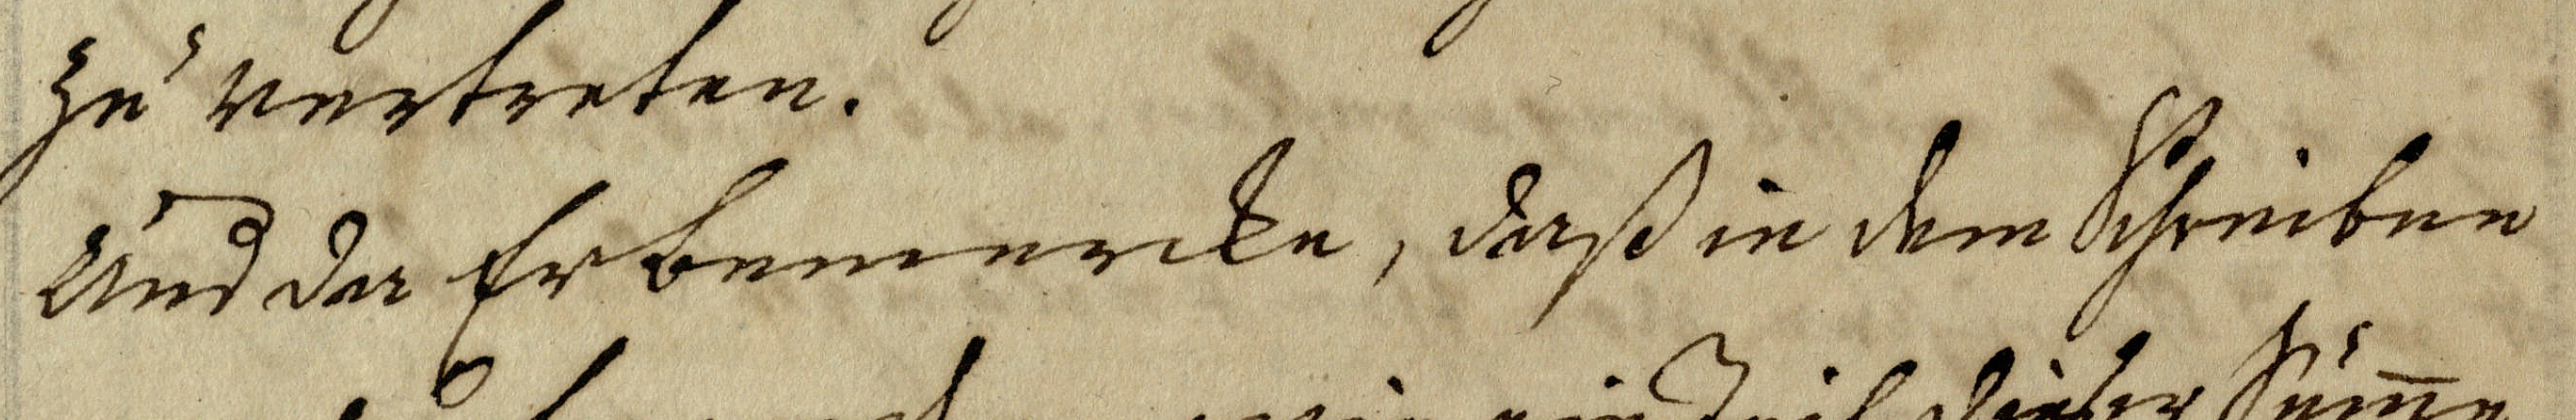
Und da Er bemercke, daß in dem Schreiben
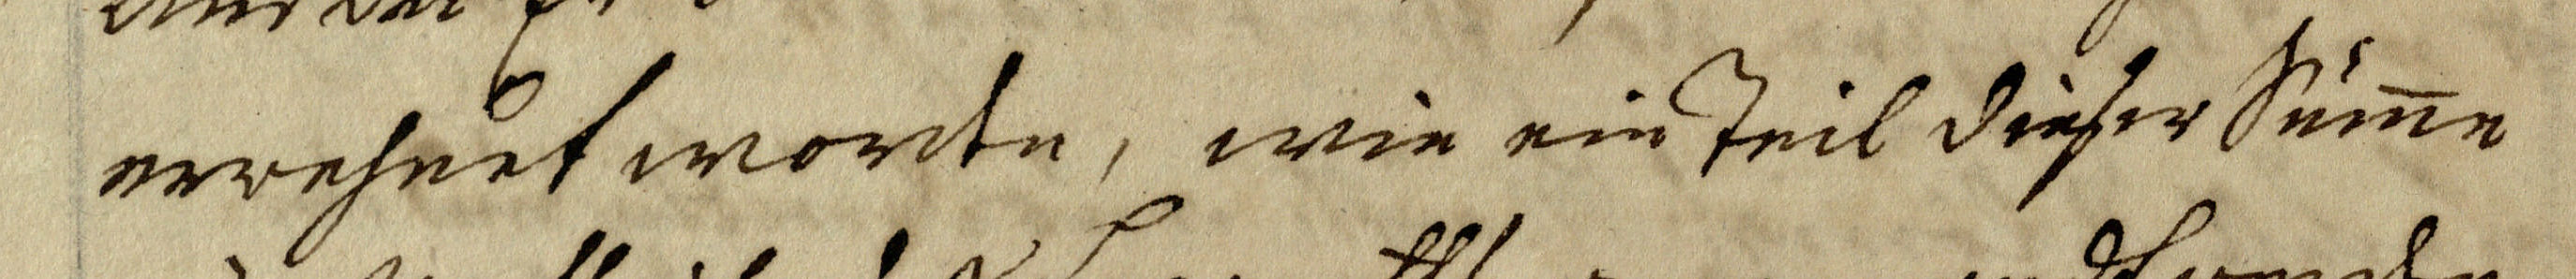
erwehnet worden, wie ein Teil dieser Sume
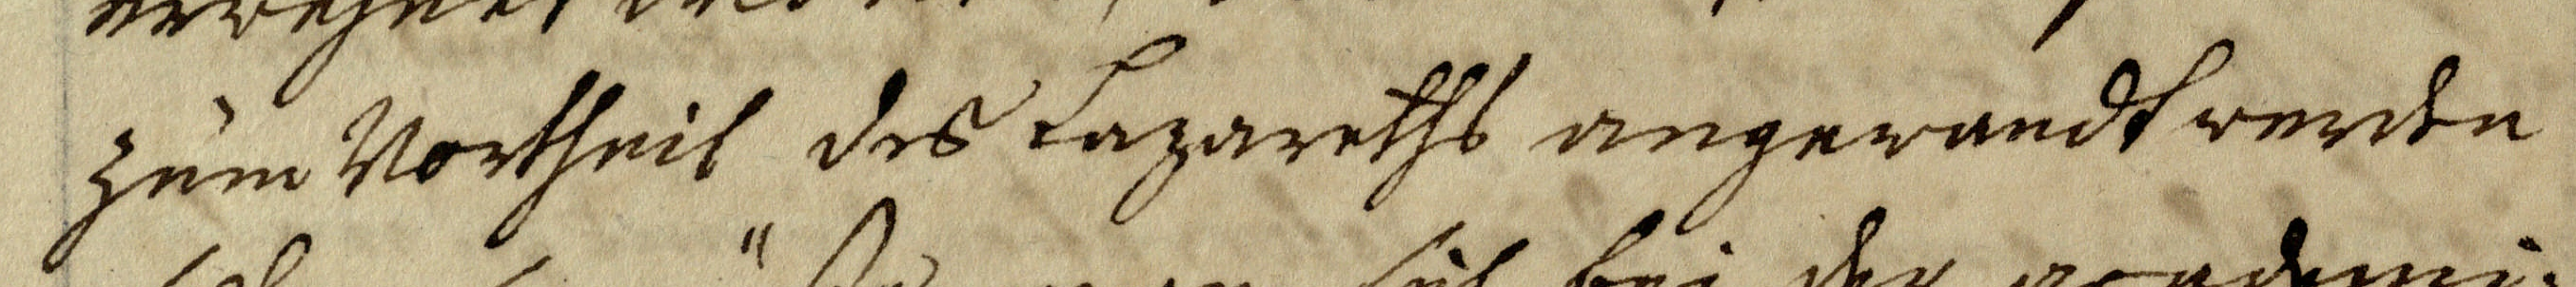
zum Vortheil des Lazareths angewandt werden
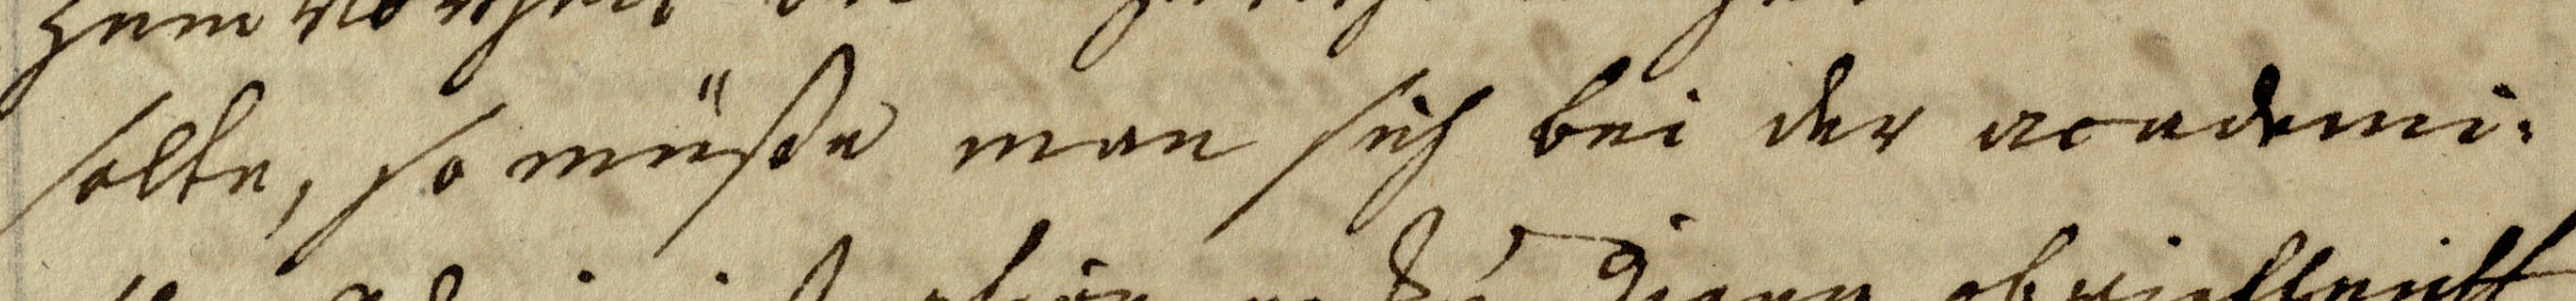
solte, so müße man sich bei der academi¬
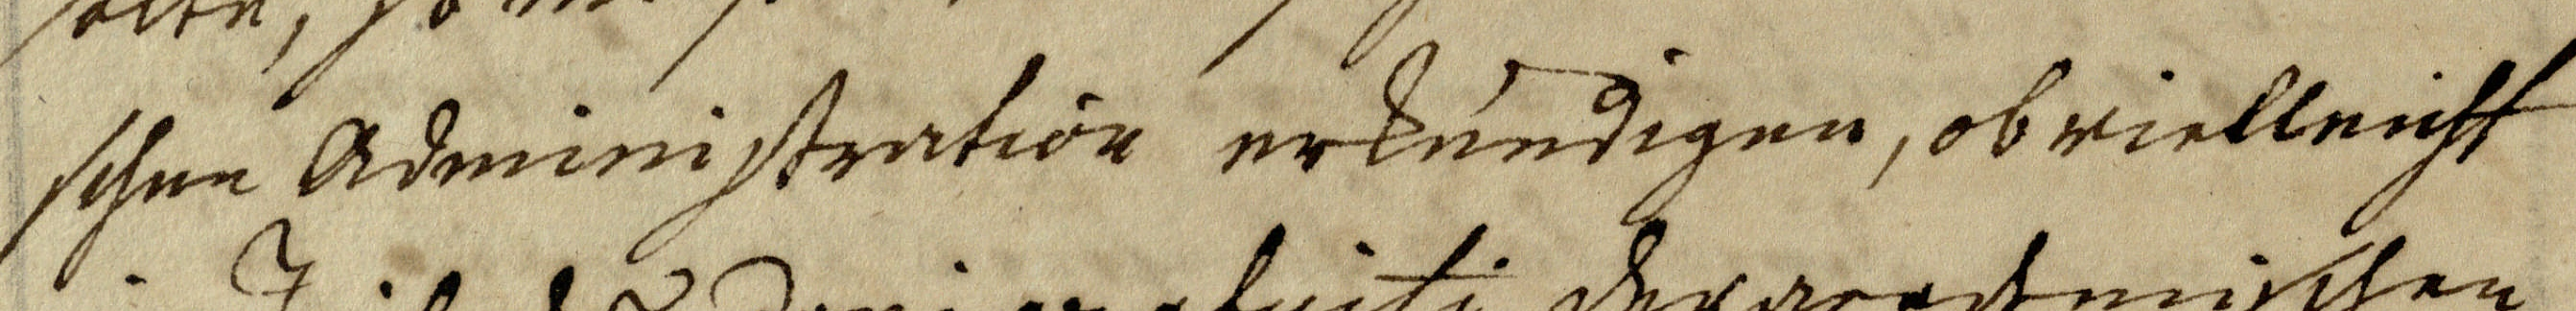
schen Administration erkundigen, ob vielleicht
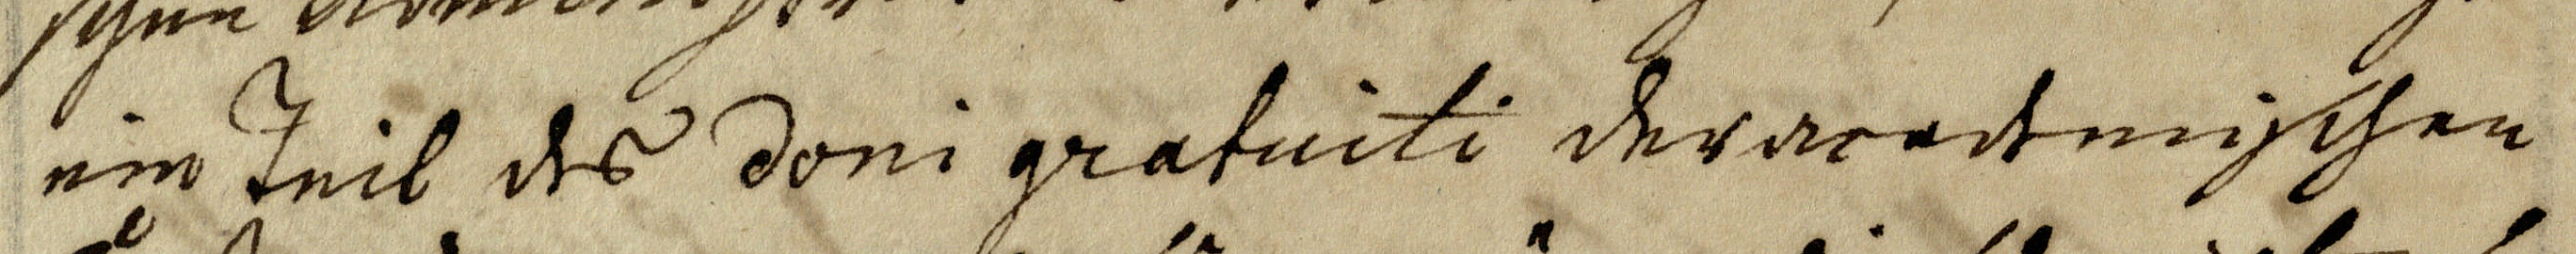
ein Teil des doni gratuiti der academischen
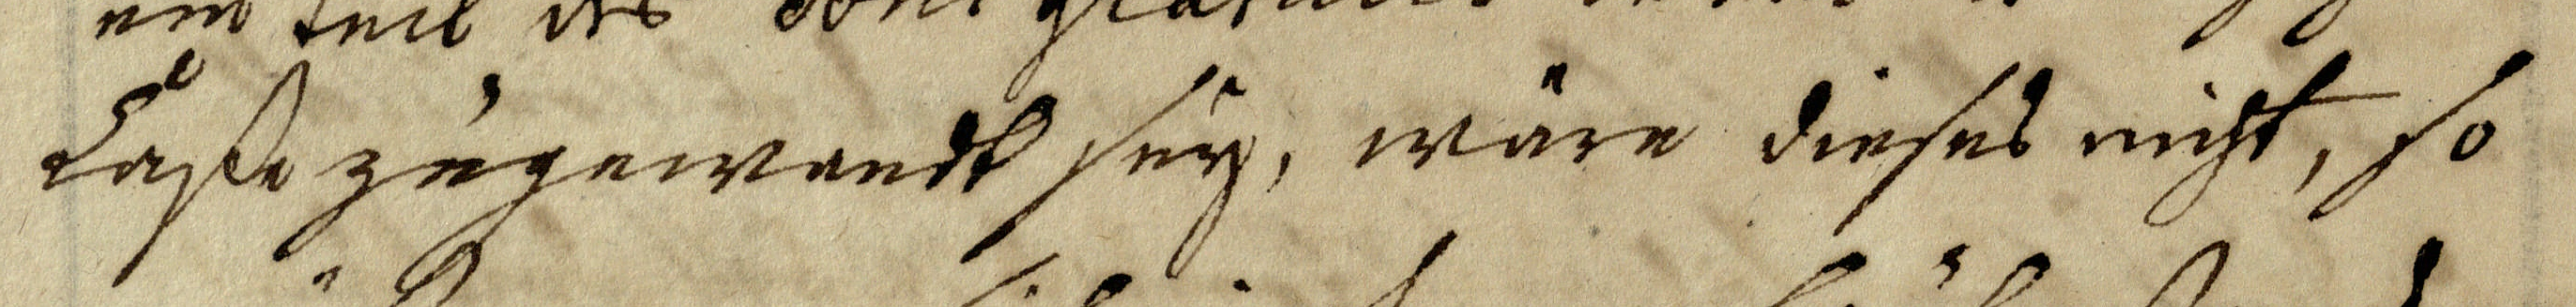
Caße zugewandt seÿ, wäre dieses nicht, so
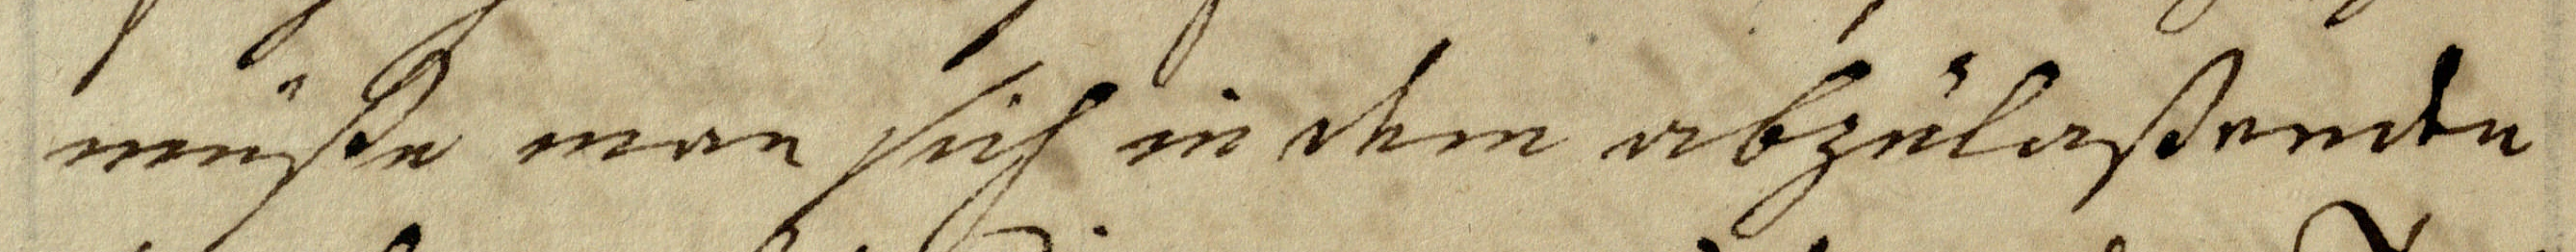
müße man sich in dem abzulaßenden
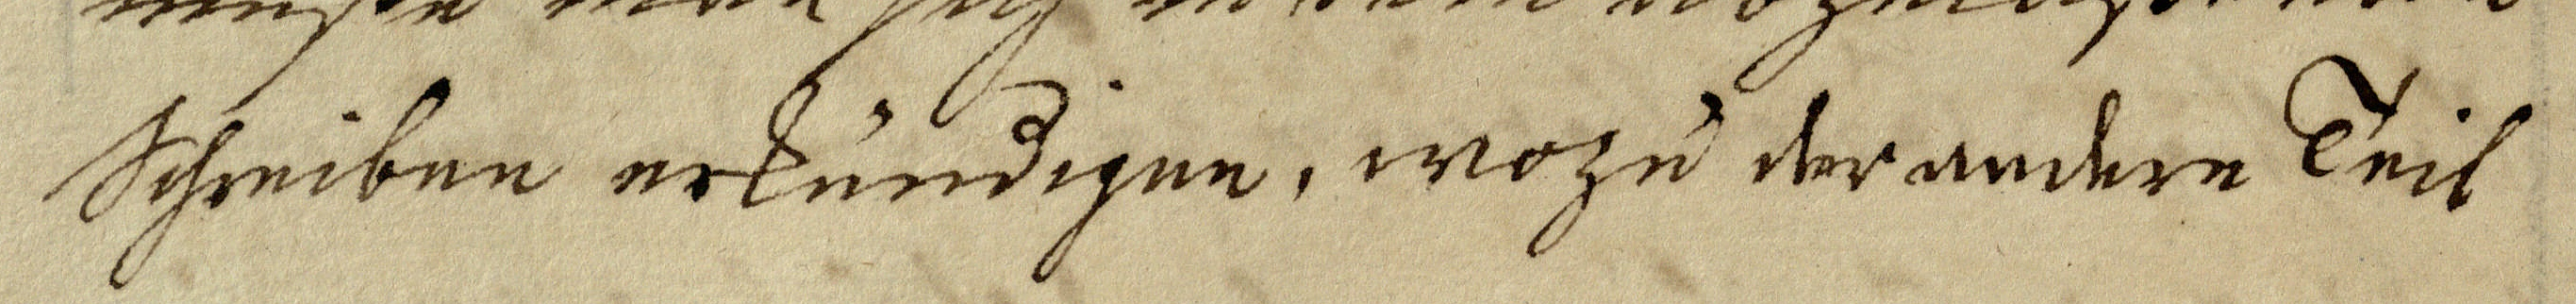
Schreiben erkundigen, wozu der andere Teil
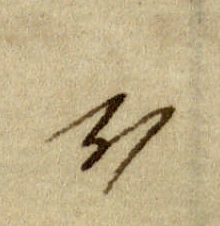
v
